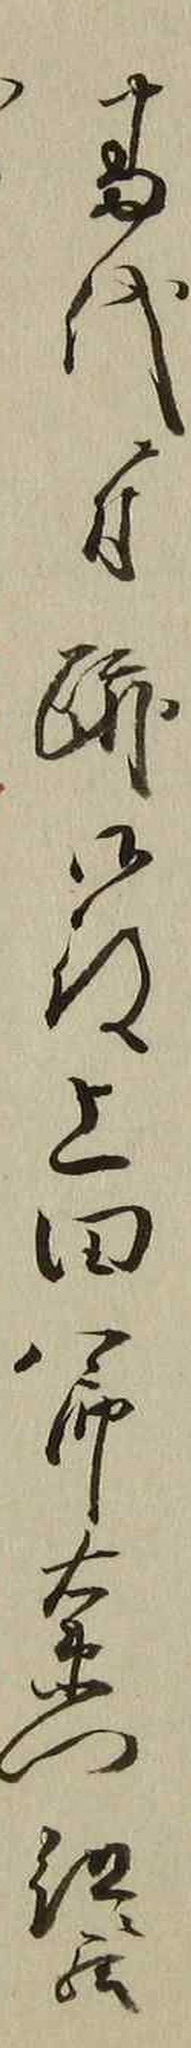番代ニ付跡御役上田八郎右衛門組ニ罷
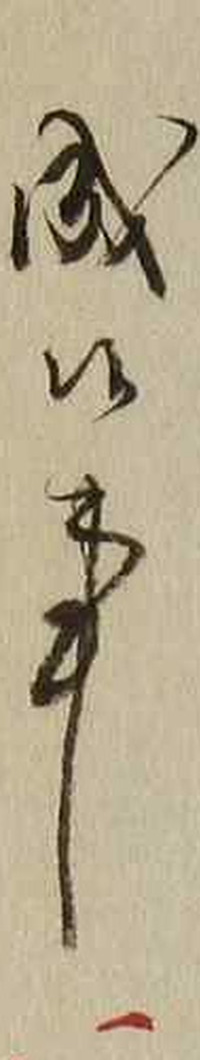成候事
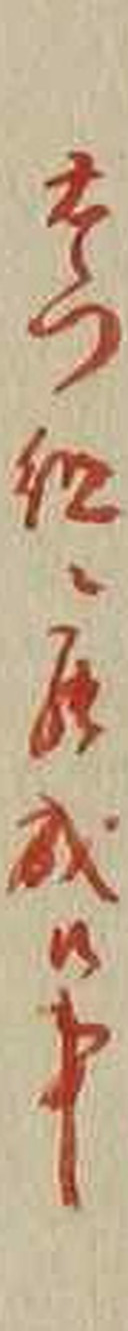右衛門組ニ罷成候事
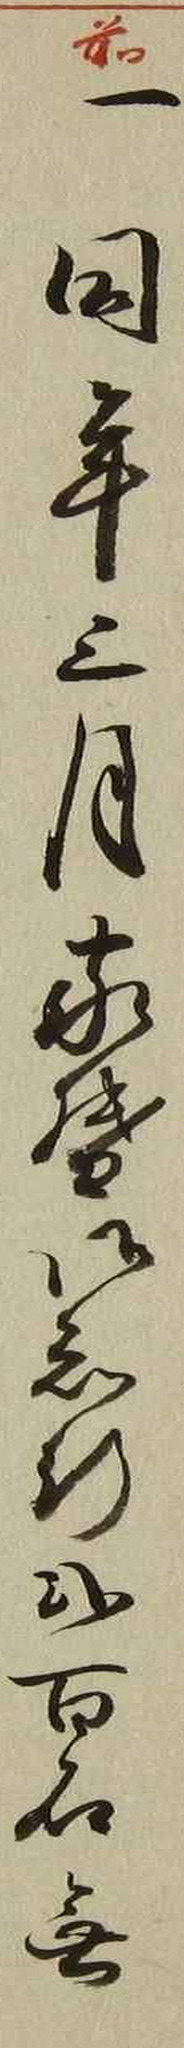前一同年三月家督御知行弐百石無
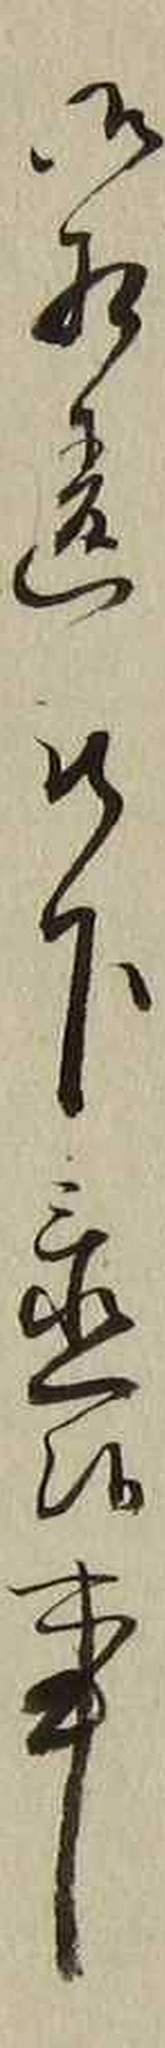御相違被下置候事
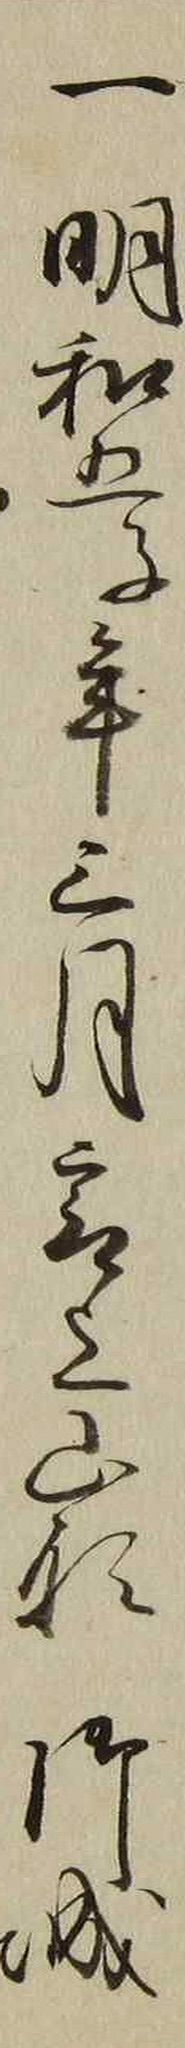一明和五子年三月最上山形御城
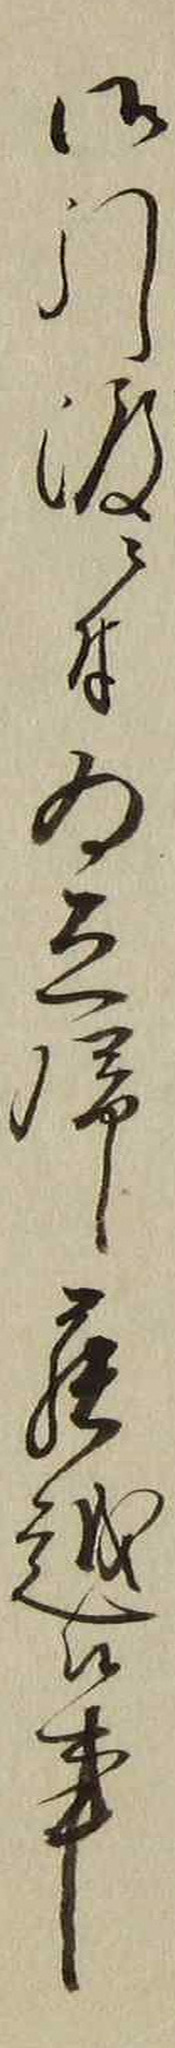御引渡ニ付為立帰罷越候事
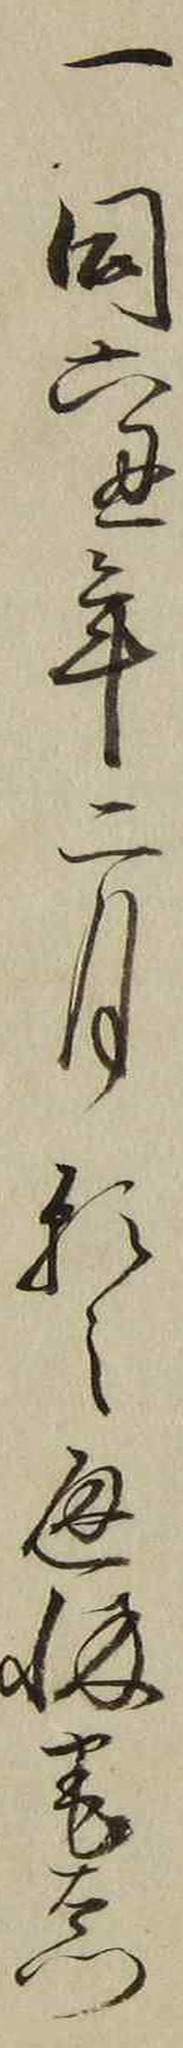一同六丑年二月願之通忰宅右衛門
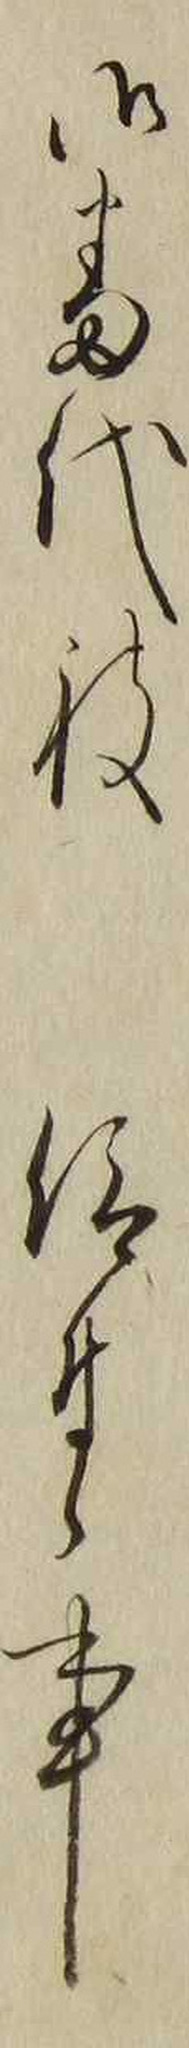御番代被仰付候事

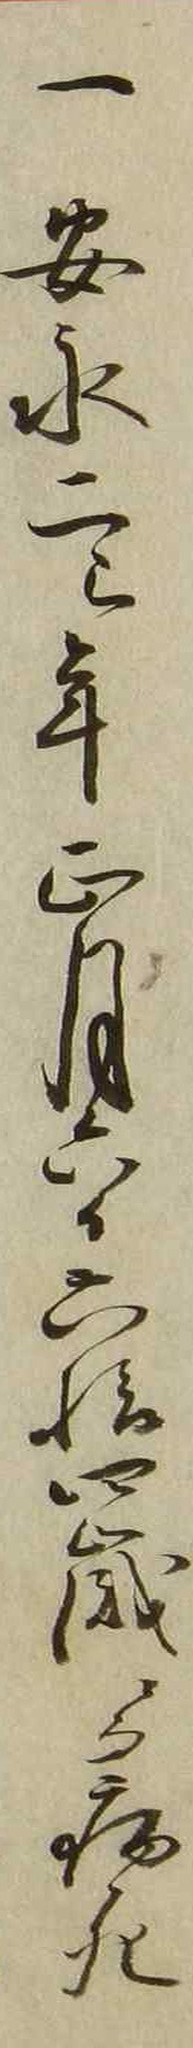一安永二巳年正月六日六拾四歳ニ而病死
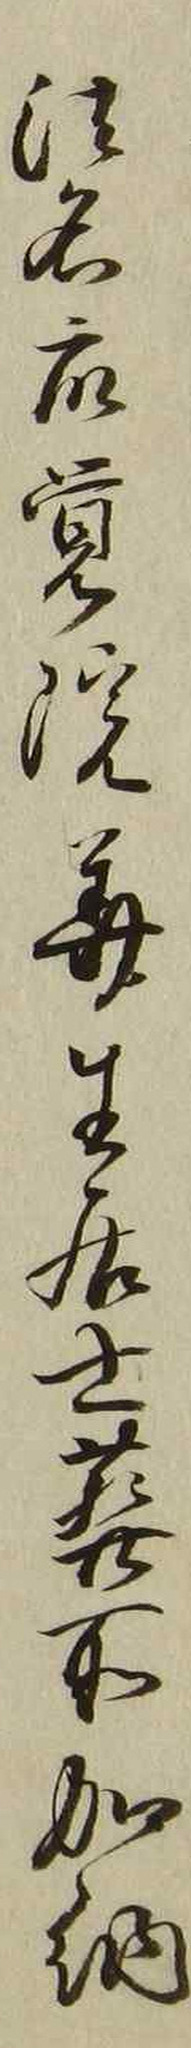法名覚院華生居士葬所加納
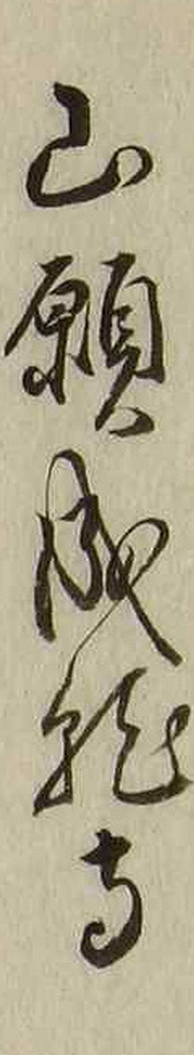山願成就寺
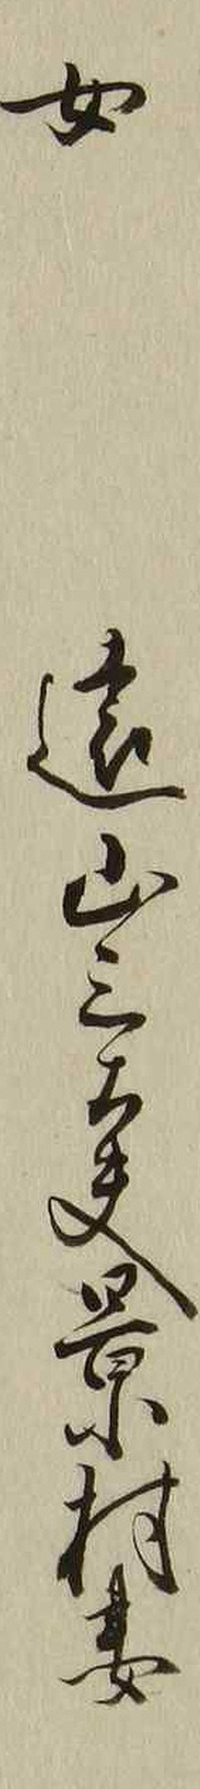女遠山三大夫景村妻
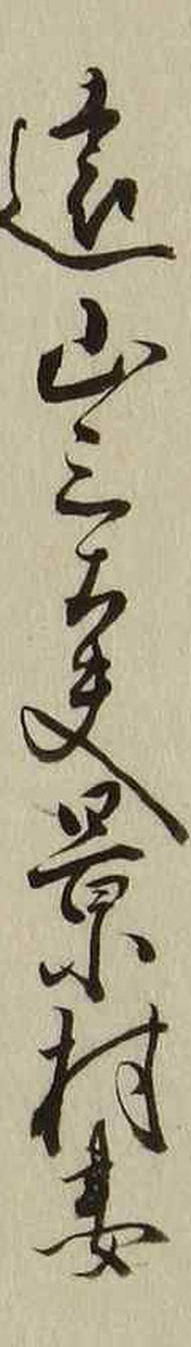女遠山三大夫景村妻
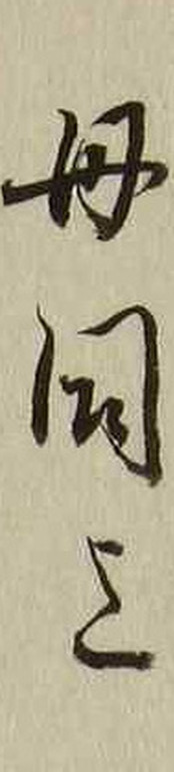母同上
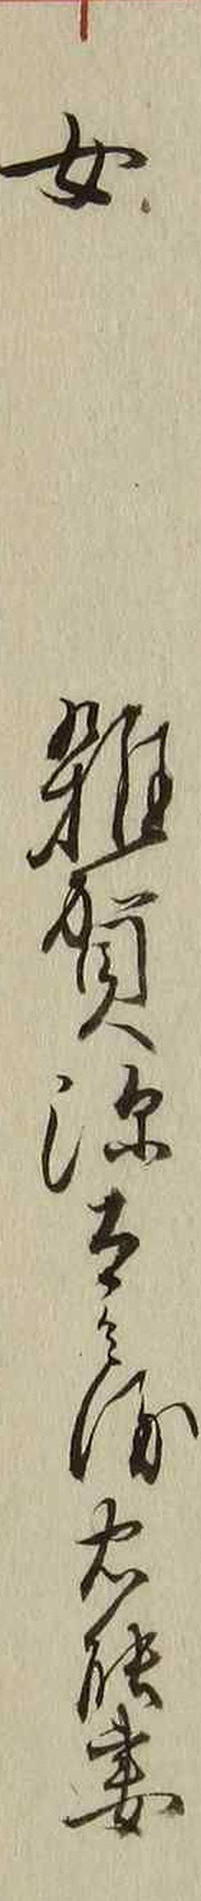女雑賀源太兵衛忠能妻
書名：諸士系譜　巻之2　い之部2
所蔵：会津若松市立会津図書館
